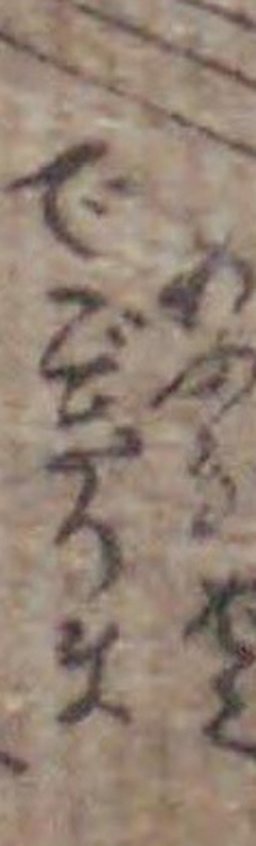でごさりま
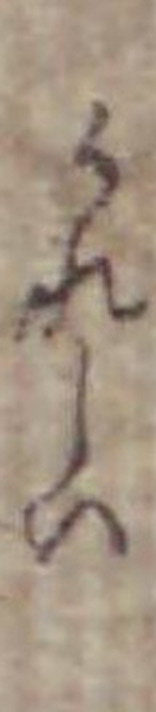うれしい
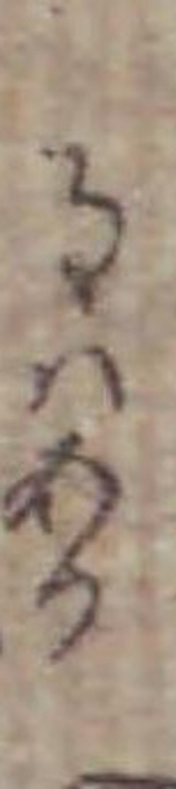事はあり
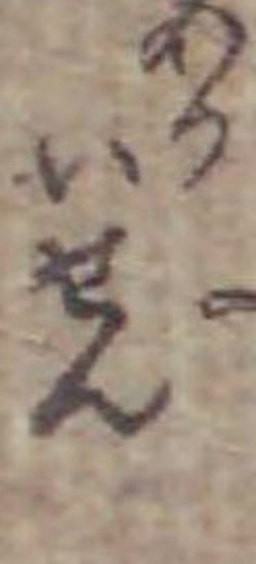いせん

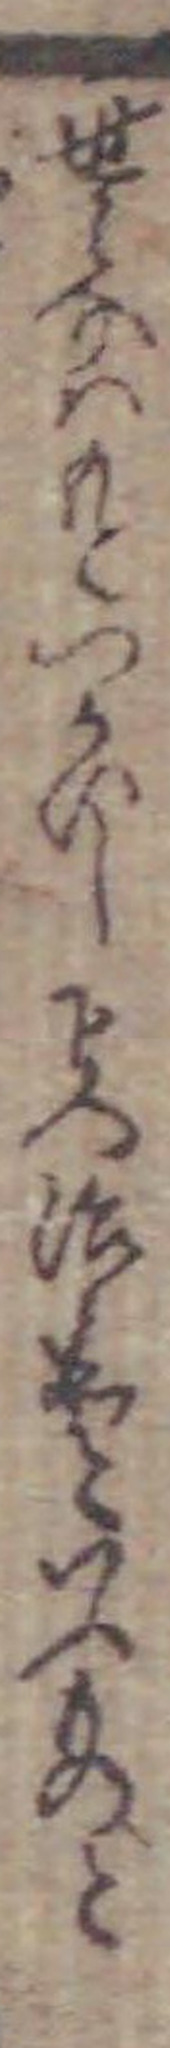世之介はもとつかいし下人治兵衛といふものと
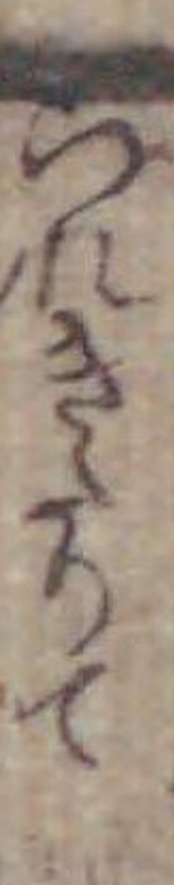つれきたりて
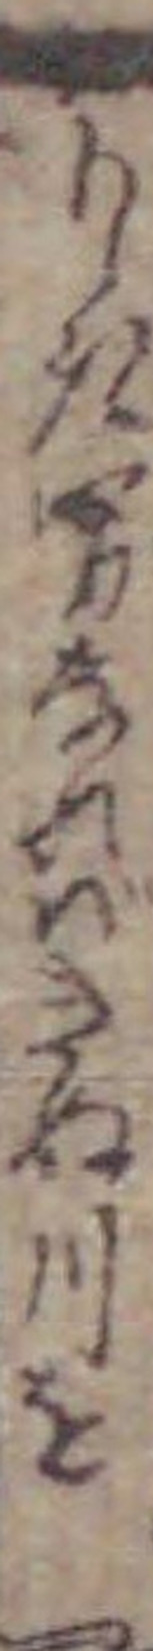もしき男なればきぬ川を
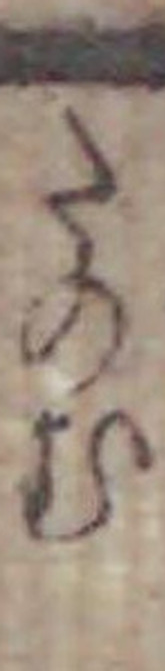たのむ
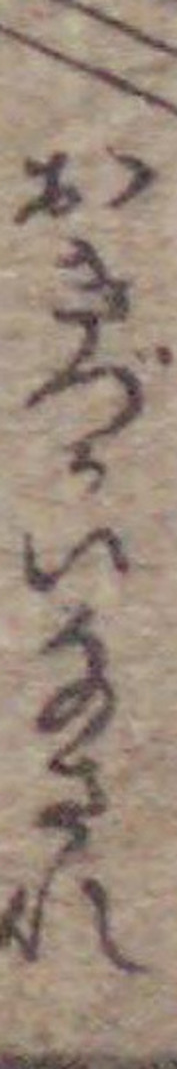おきづかいなされ
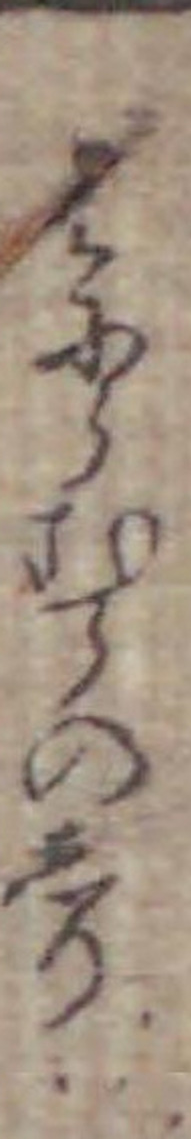はにう村のしり
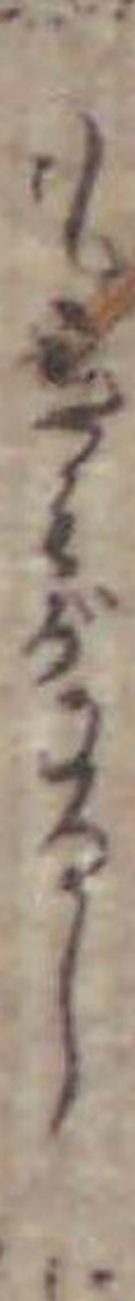もきみがわるし
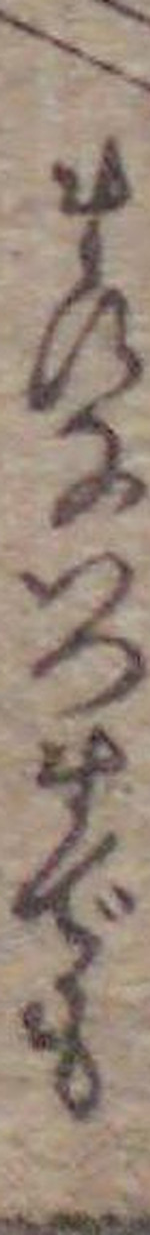ますないつまでも
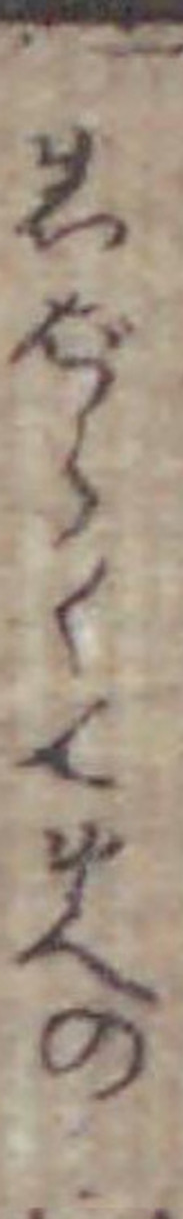しばらくてまへの
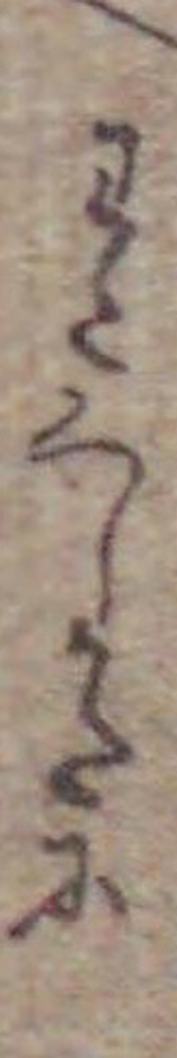わたくしかたに
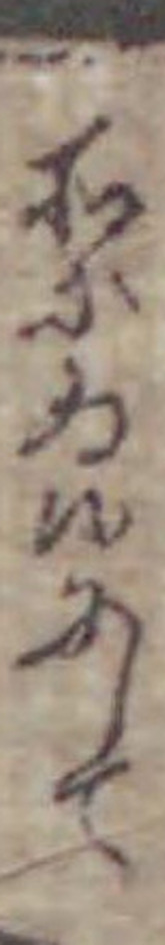所にゐ候にして
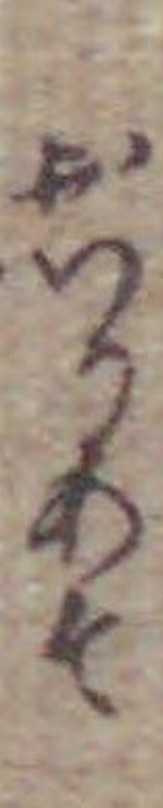おいりあそ
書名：嗚呼不侭世之助噺 : 3巻
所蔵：国立国会図書館 National Diet Library, JAPAN
